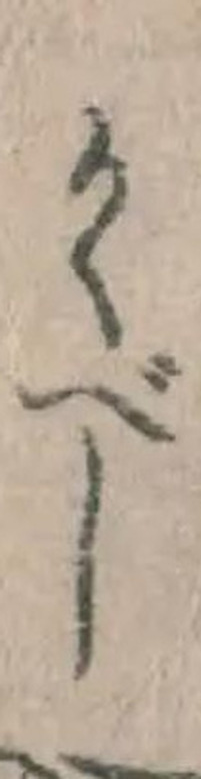かくべし

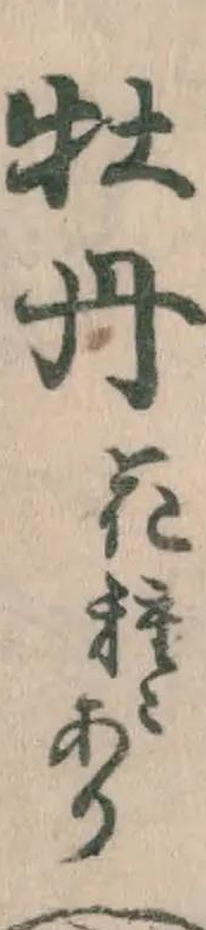牡丹花種々あり
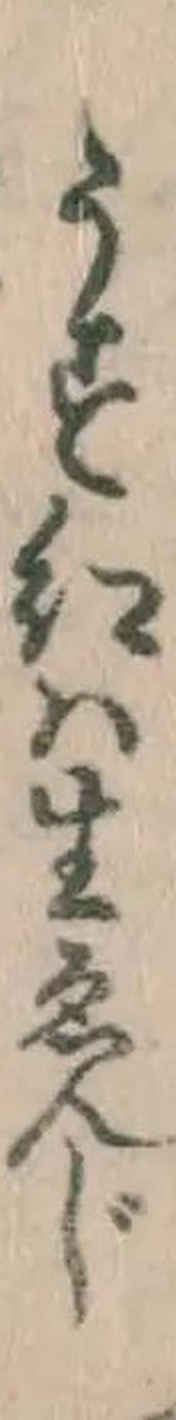うす紅は生ゑんじ
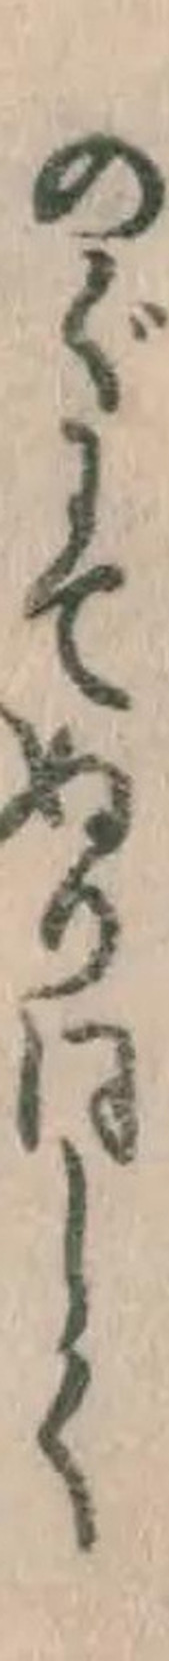のぐにてぬり同しく
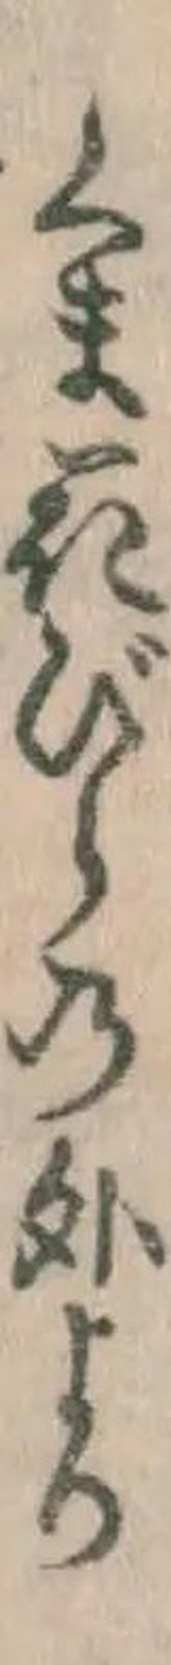くは花びらの外より
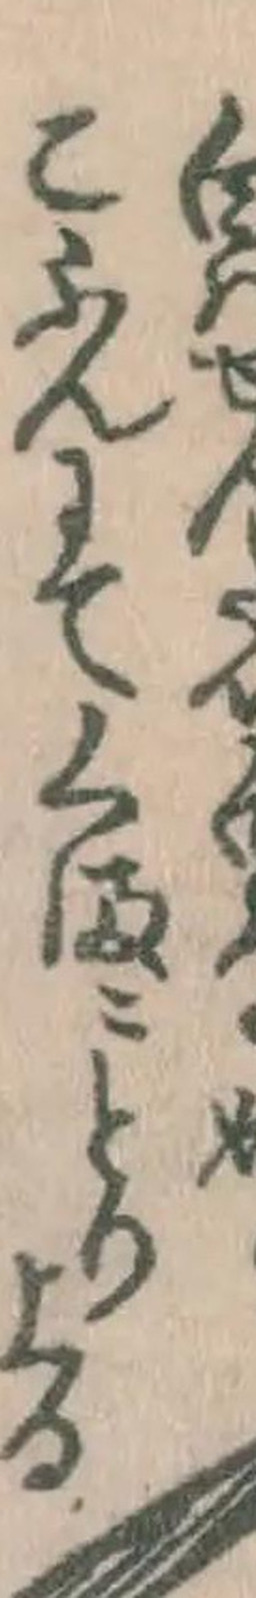こふんにてくまにとりかけ
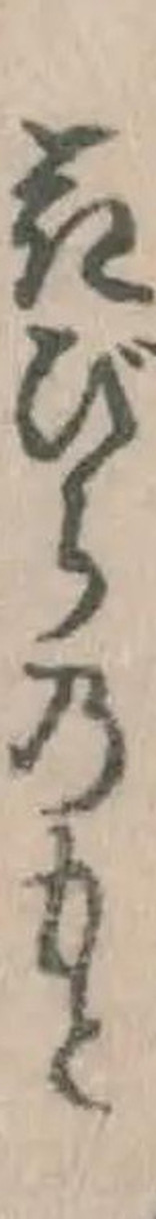花びらのもと
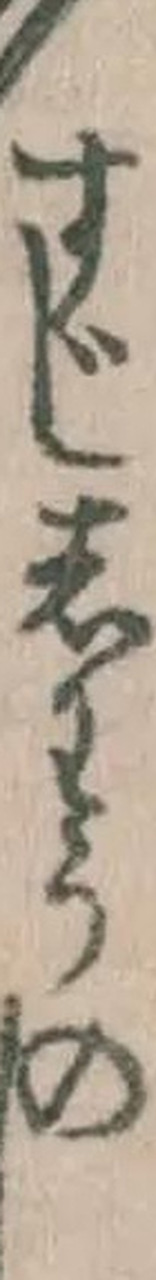すじしわうの
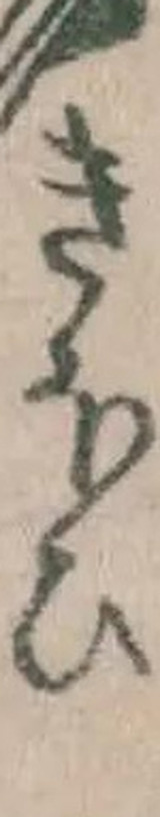きほひ

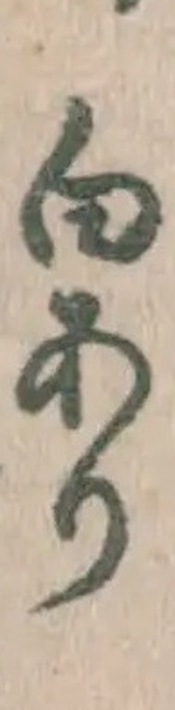白あり
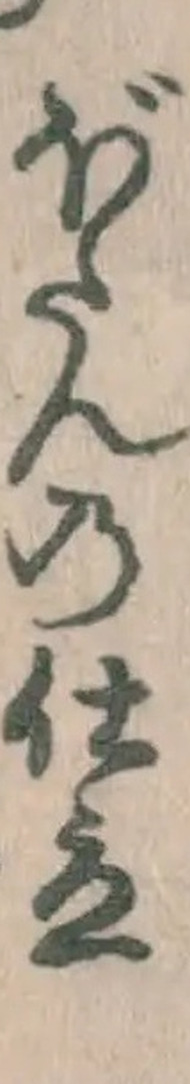ぼたんの仕立
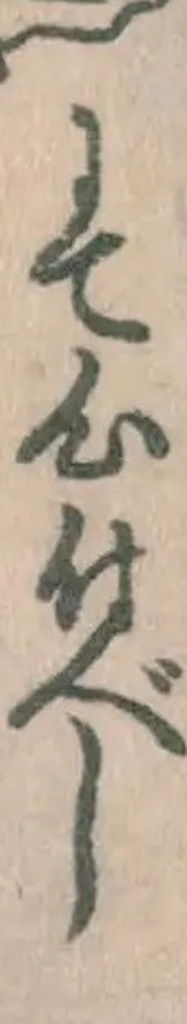にて心付べし
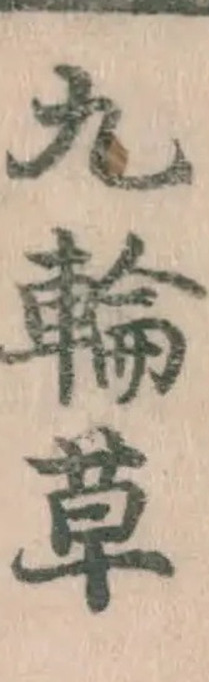九輪草
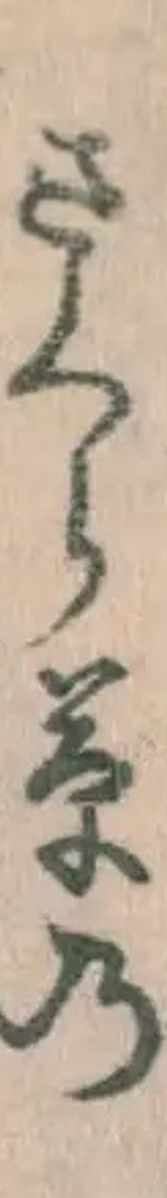さくら草の
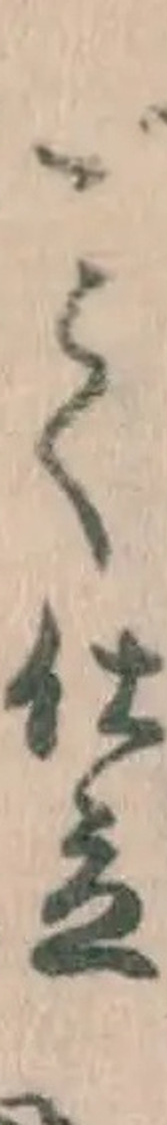ごとく仕立
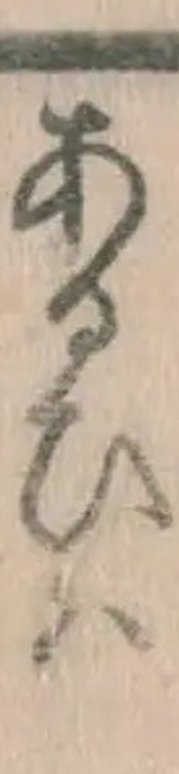あるひは
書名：絵本時津艸
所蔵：国立国会図書館 National Diet Library, JAPAN
